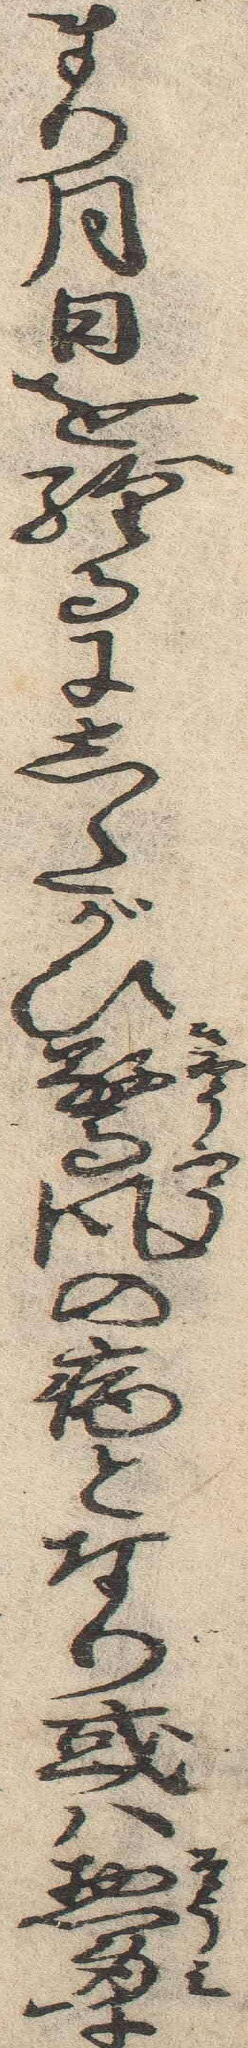まり月日を経るにしたがひ驚風の病となり或は惣身に
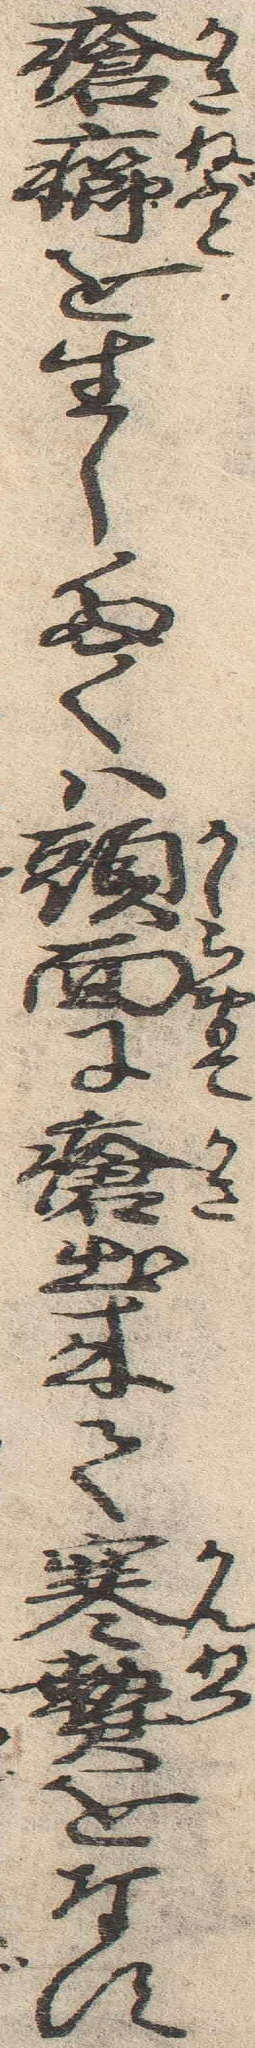瘡癤を生し多くは頭面に瘡出来て寒熱をなす
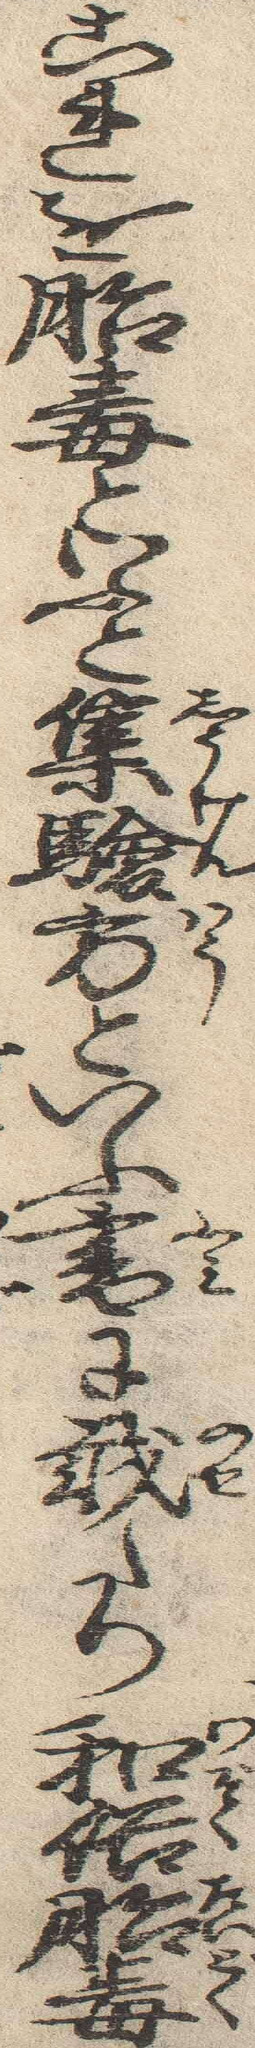これを胎毒といふと集驗方といふ書に載たり和俗胎毒
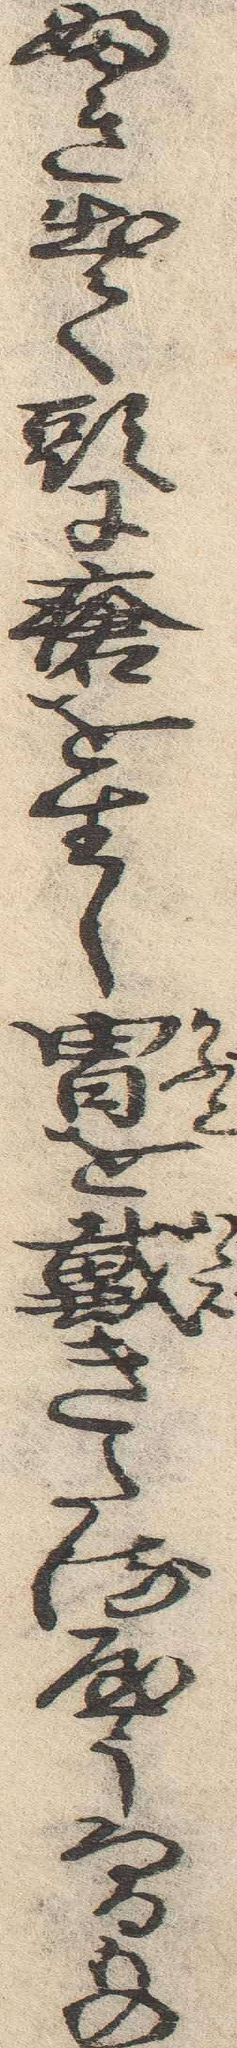ふき出て頭に瘡を生し冑を戴きたるやうなるもの
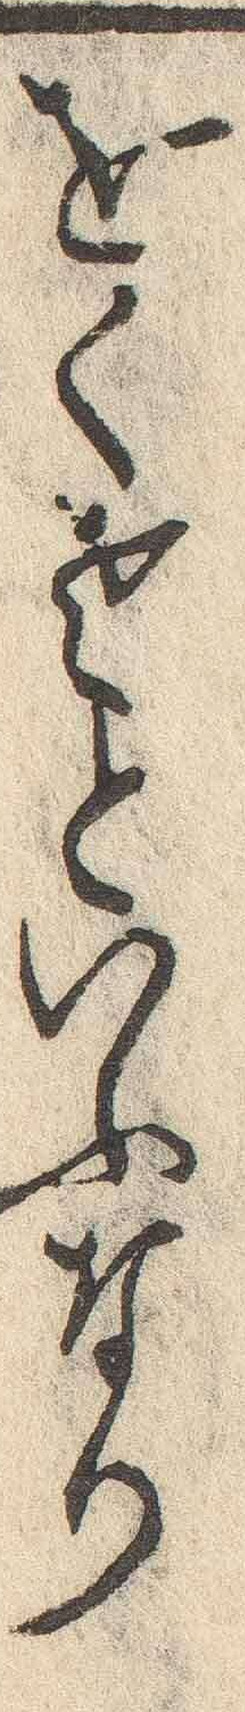をくさといふなり
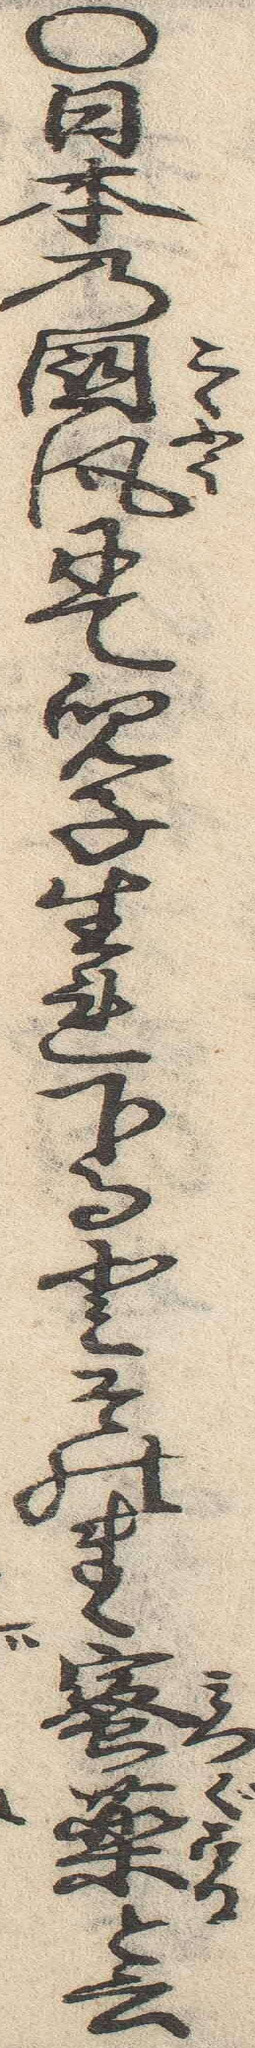◯日本の國風にて児子生れ下るとそのまゝ蜜薬と云
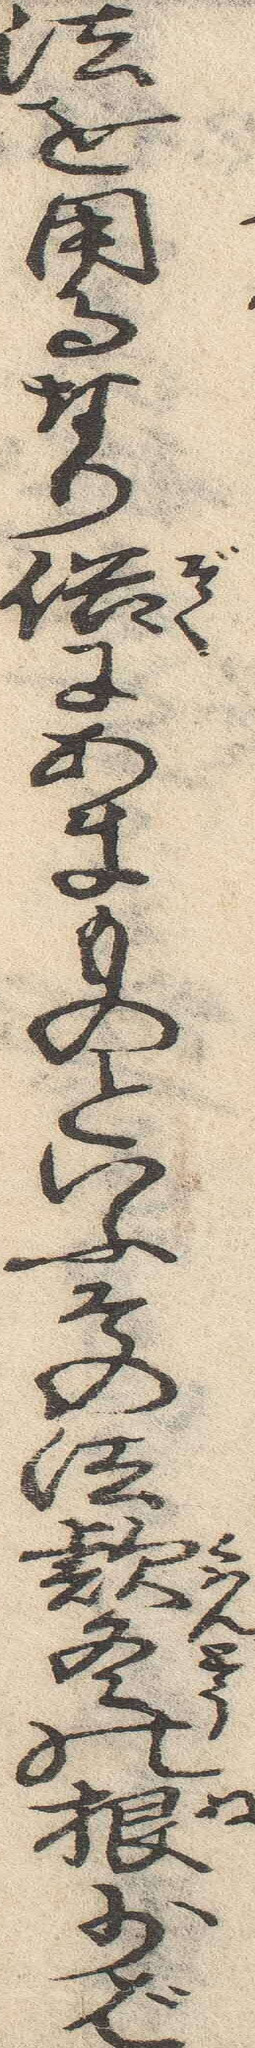法を用るなり俗にあまものといふその法款冬の根少ば
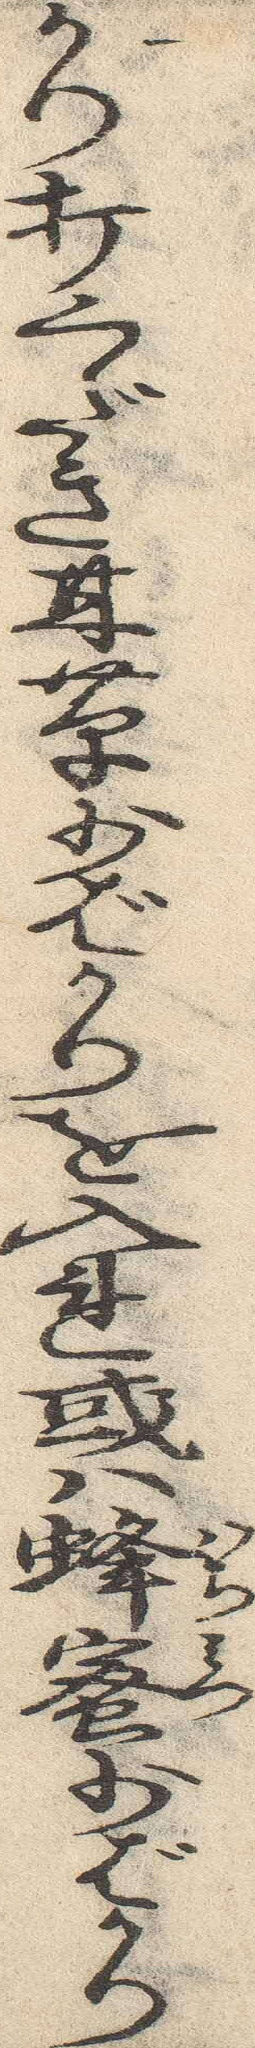かり打くだき其草少ばかりを入れ或は蜂蜜少ばかり
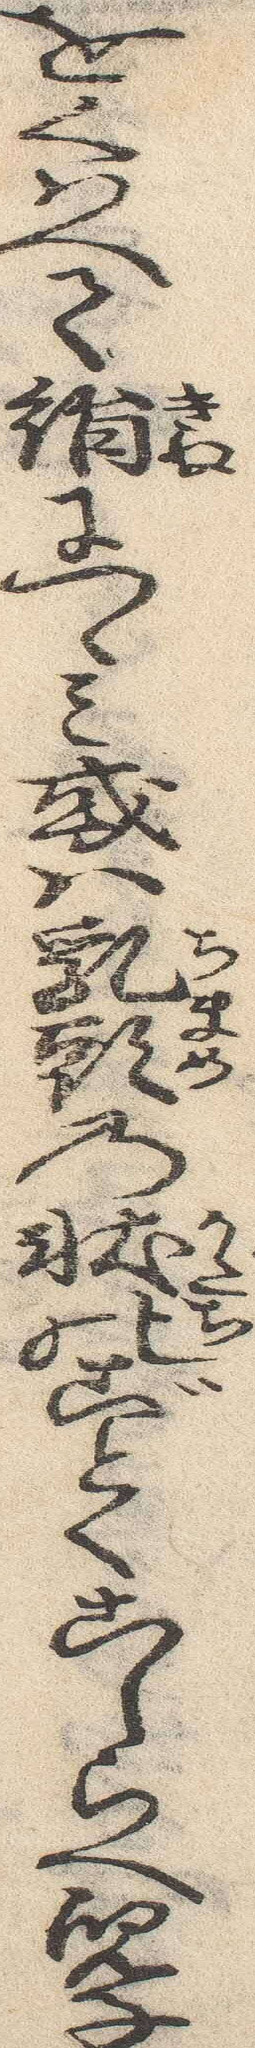をくはへて絹につゝみ或は乳頭の状のごとくこしらへ児子
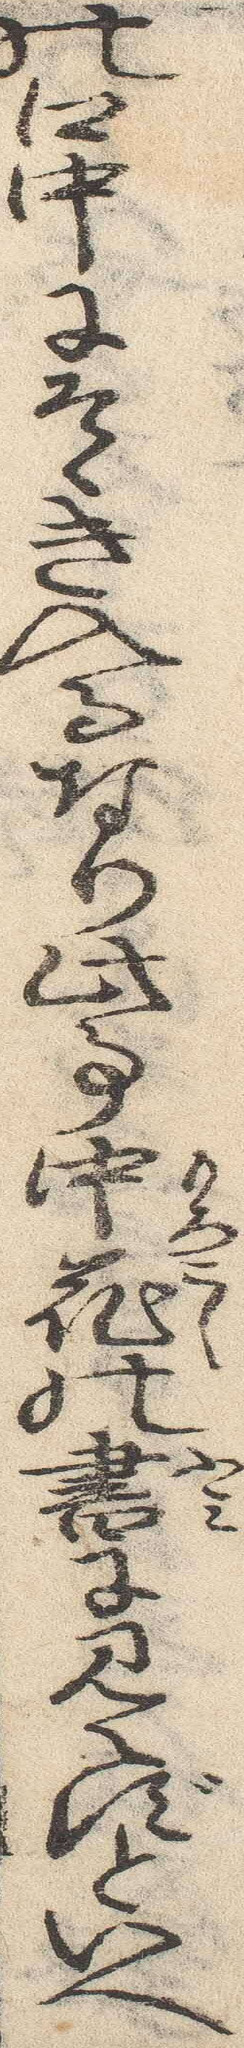の口中にそゝき入るなり此事中花の書に見へずといへ
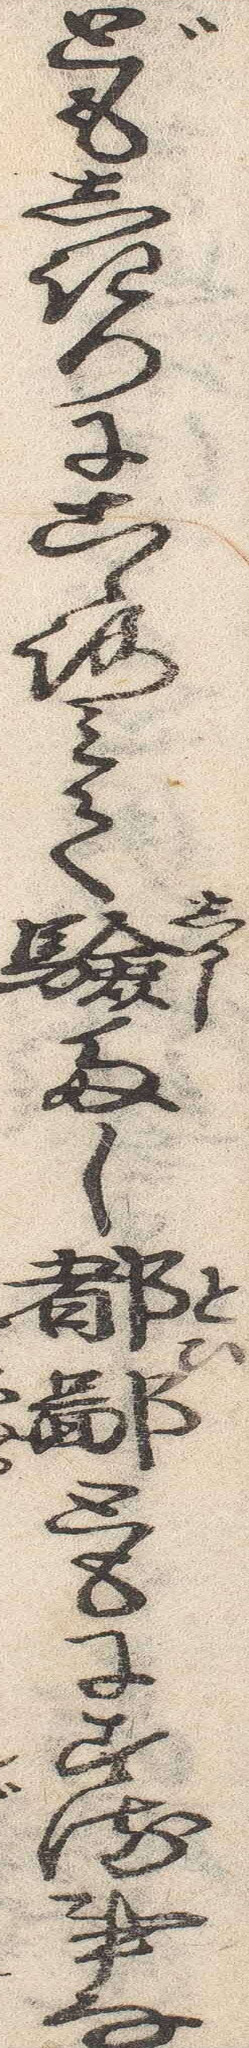どもしきりにこゝろみて驗多し都鄙ともにする事な
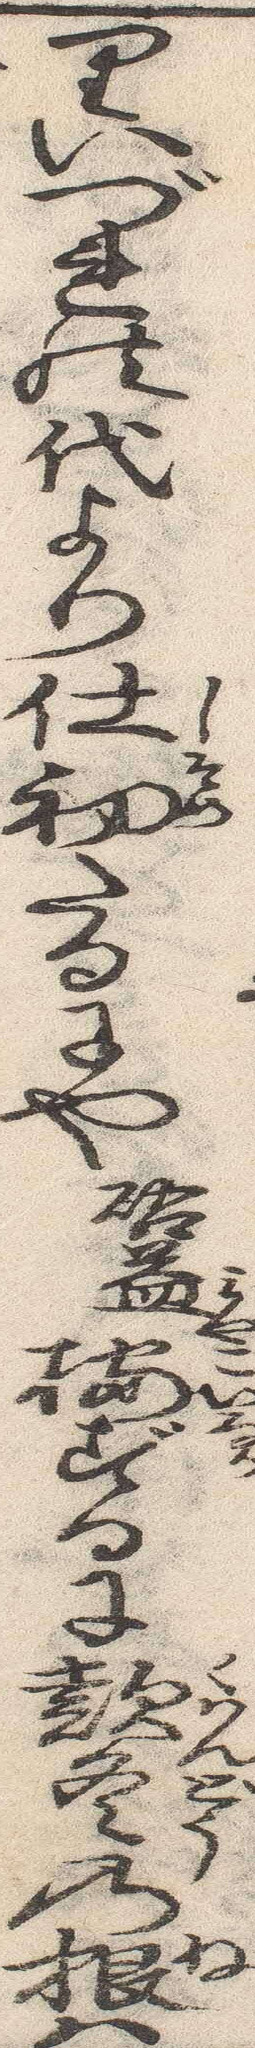りいづれの代より仕初めたるにや啓益按ずるに款冬の根は
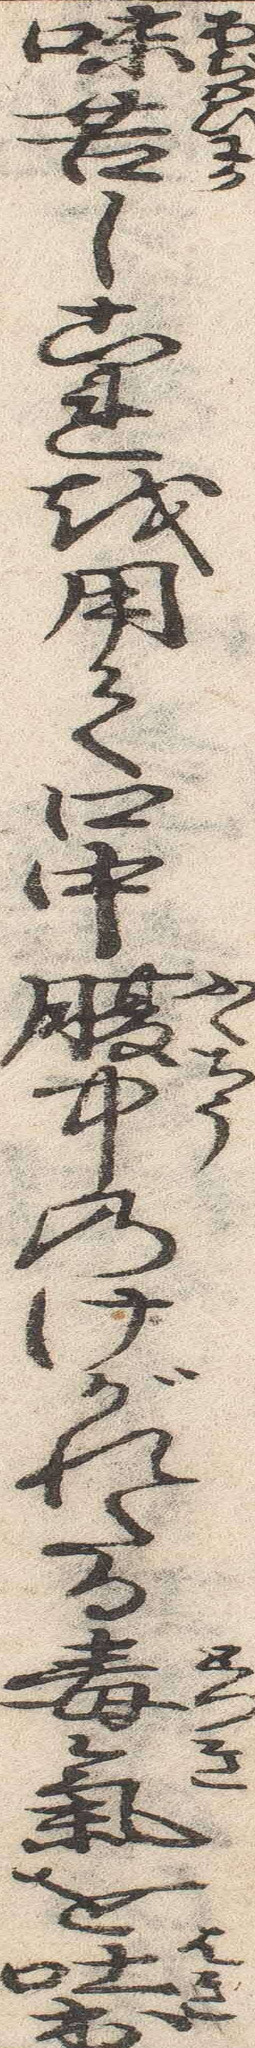味苦しこれを用て口中腹中のけがれたる毒氣を吐出
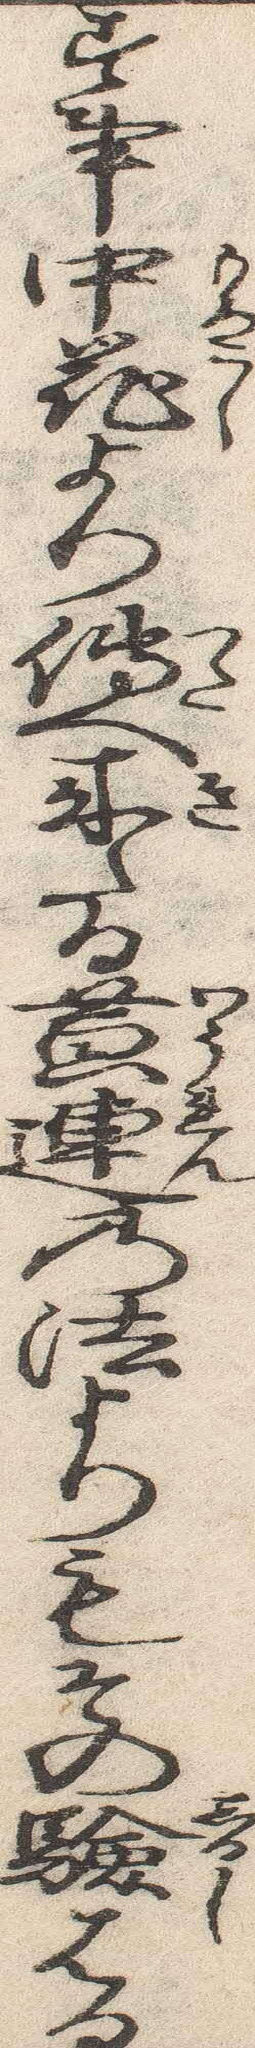す事中花より傳へ來たる黄連の法よりもその驗はる
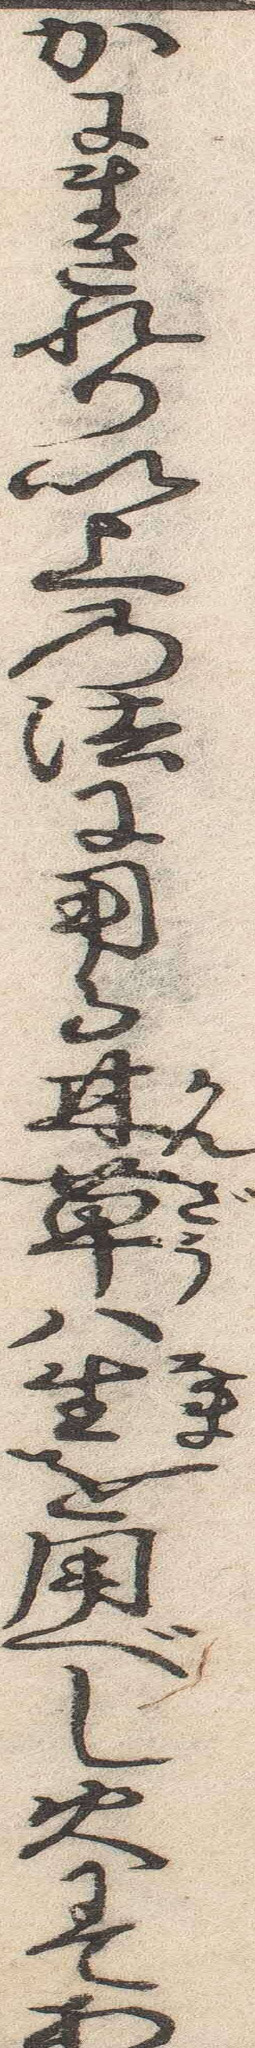かにまされり以上の法に用る甘草は生を用べし火にてあ
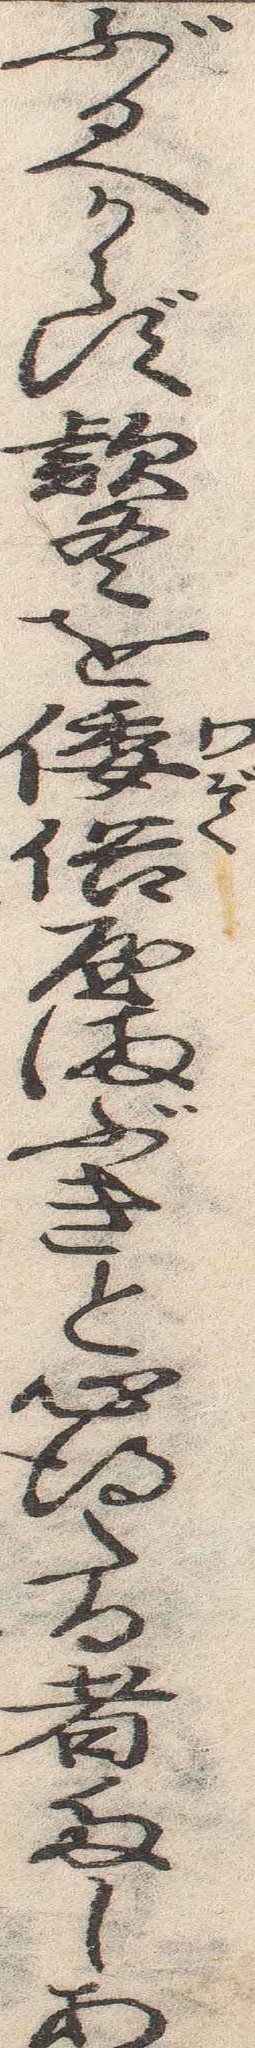ぶるへからず款冬を倭俗やまぶきと心得たる者多しあ
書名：小児必用養育草
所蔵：東京学芸大学附属図書館 国文学研究資料館
